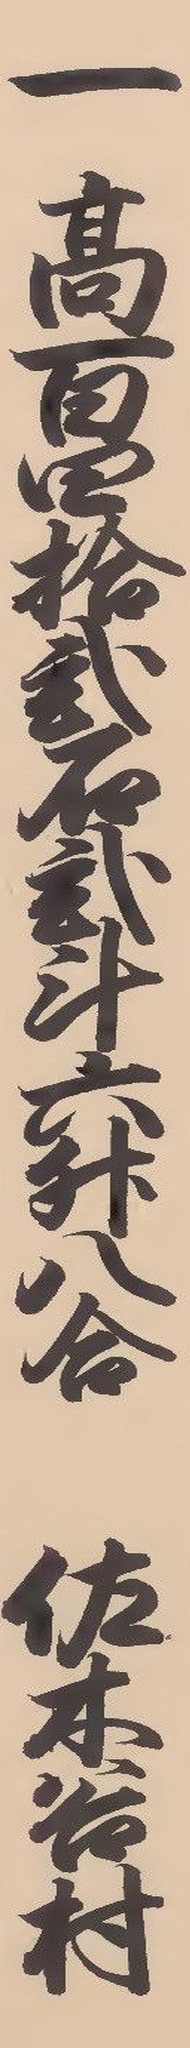一高百四拾弐石弐斗六升八合佐木谷村
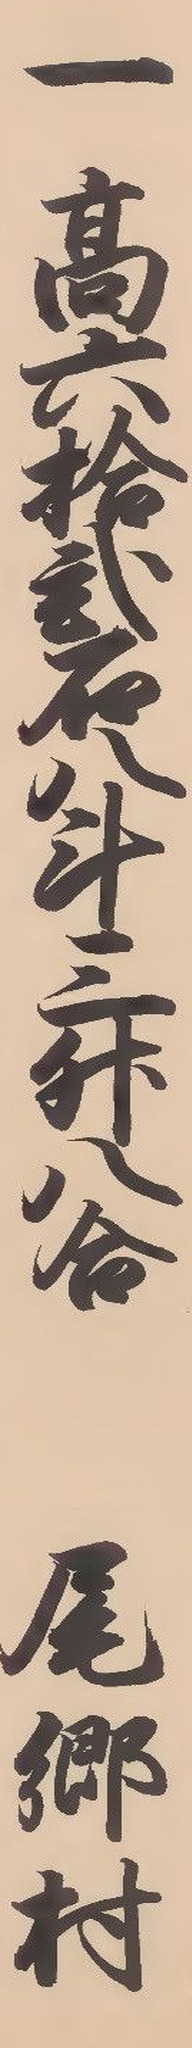一高六拾弐石八斗三升八合尾郷村
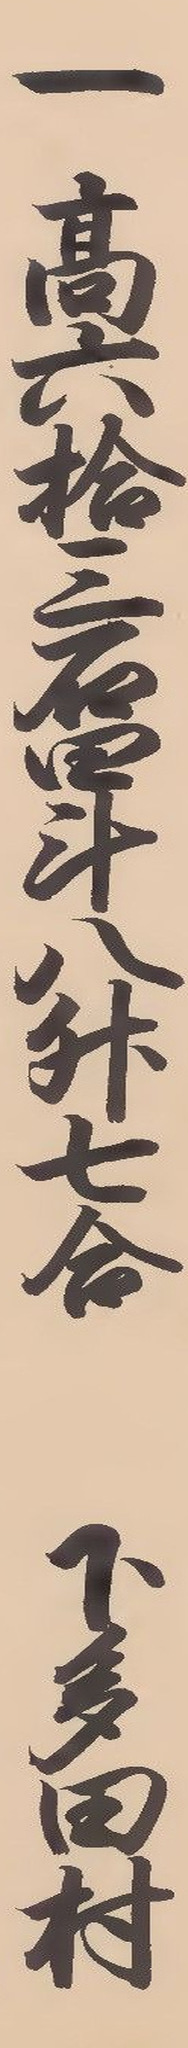一高六拾三石四斗八升七合下多田村
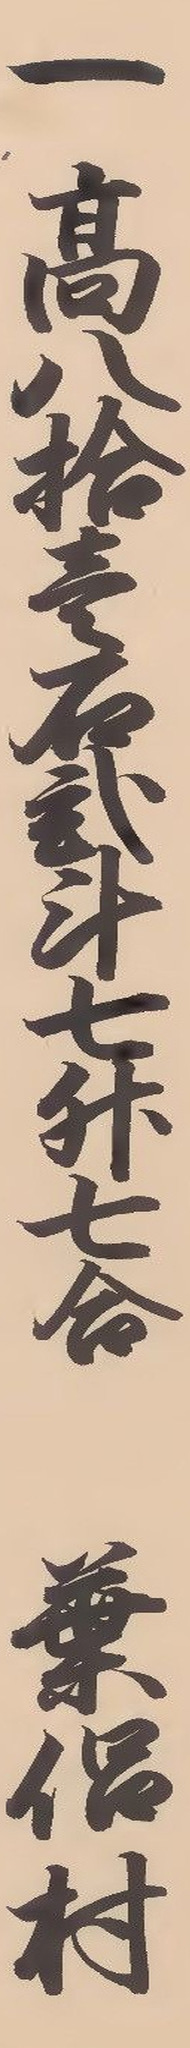一高八拾壱石弐斗七升七合葉侶村
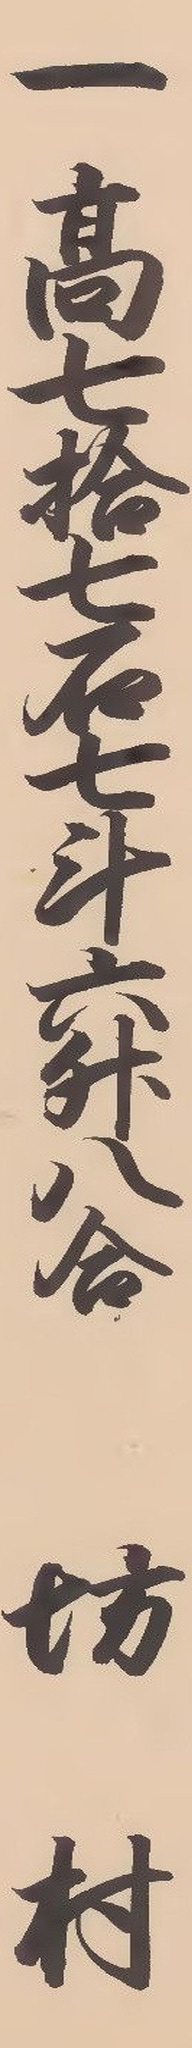一高七拾七石七斗六升八合坊村
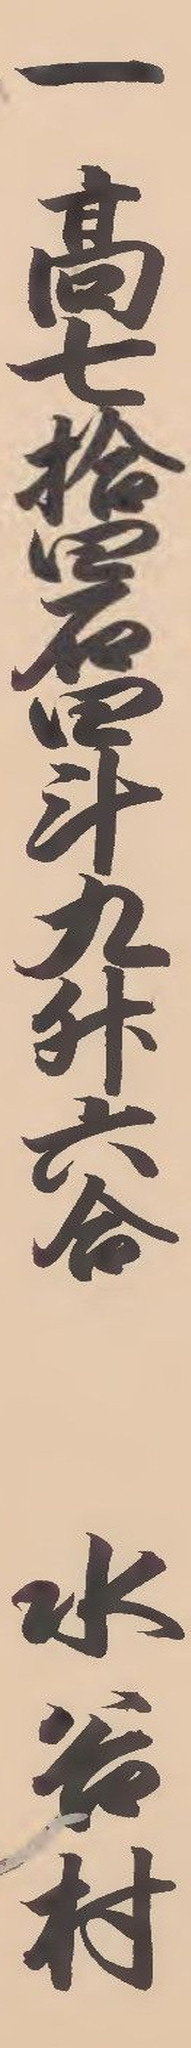一高七拾四石四斗九升六合水谷村

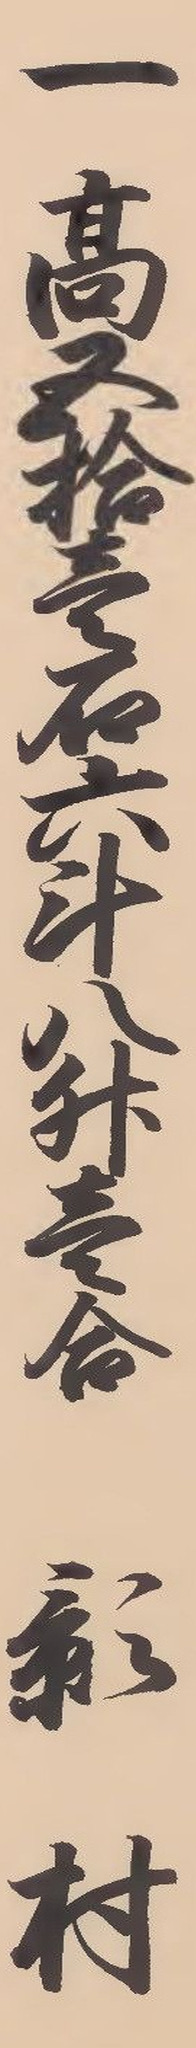一高五拾壱石六斗八升壱合影村
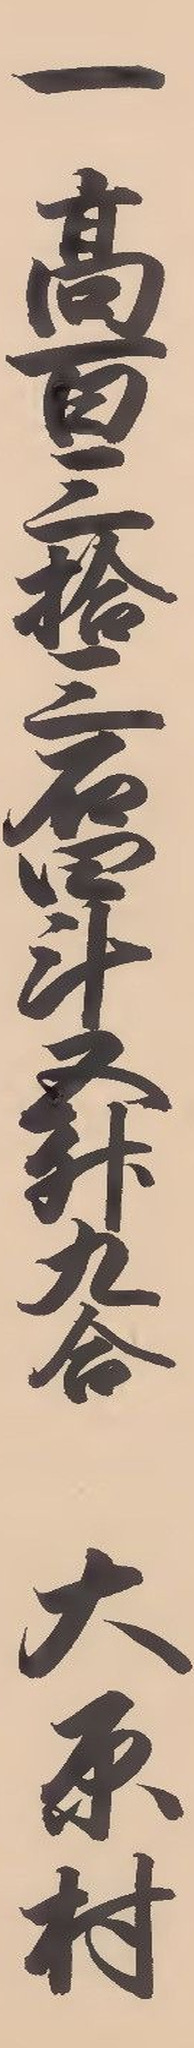一高百三拾三石四斗五升九合大原村
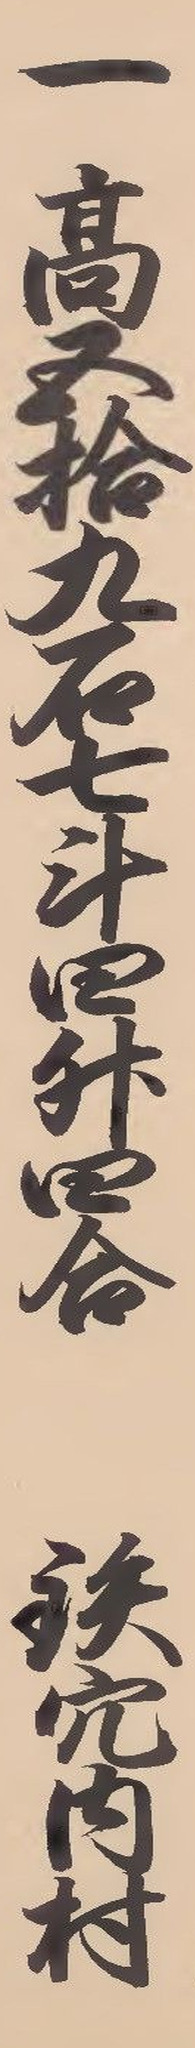一高五拾九石七斗四升四合鉄穴内村
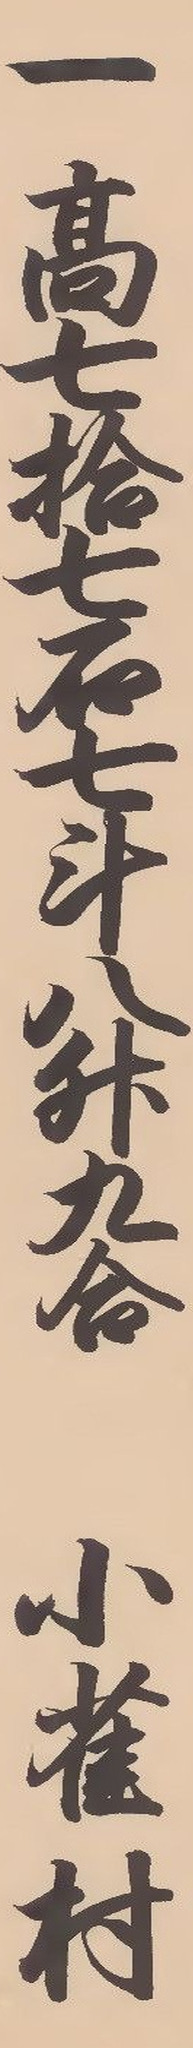一高七拾七石七斗八升九合小雀村
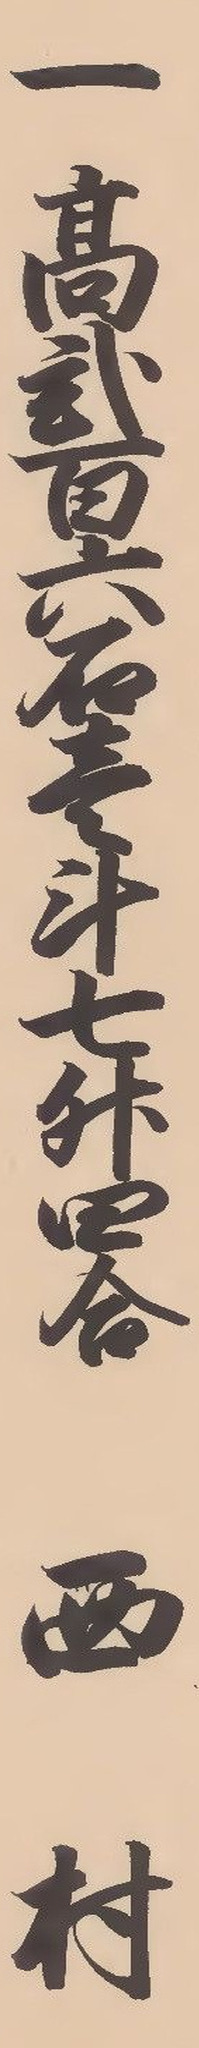一高弐百六石壱斗七升四合西村
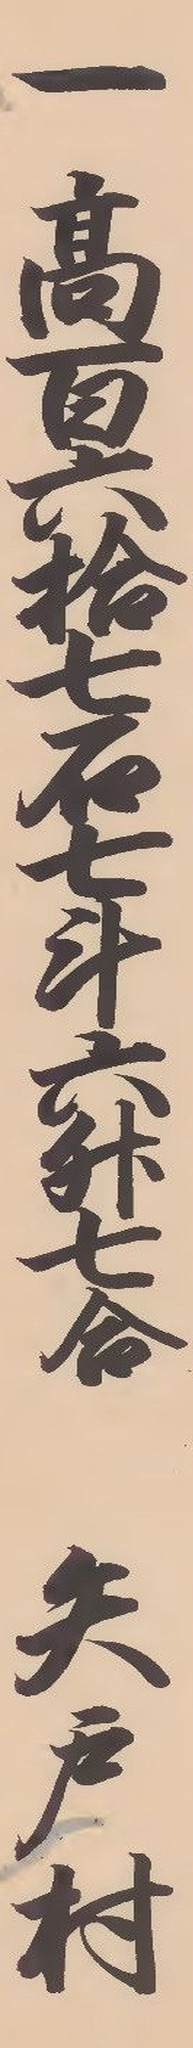一高百六拾七石七斗六升七合矢戸村

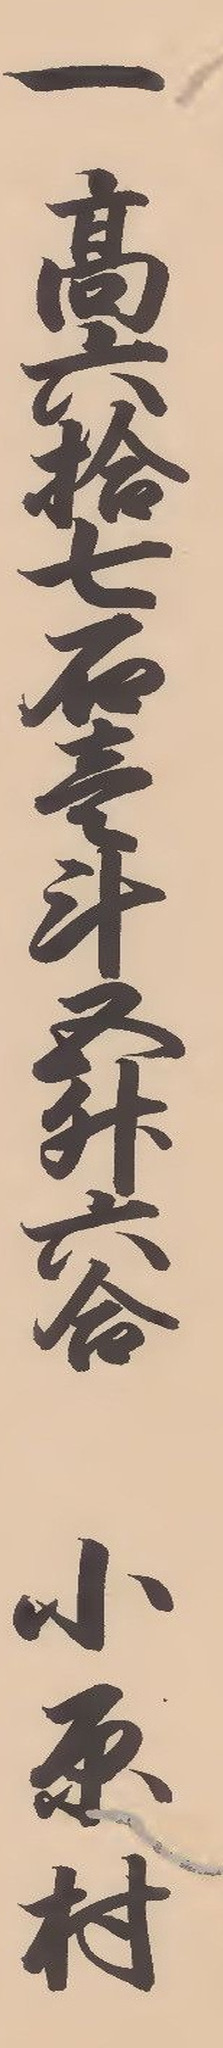一高六拾七石壱斗五升六合小原村
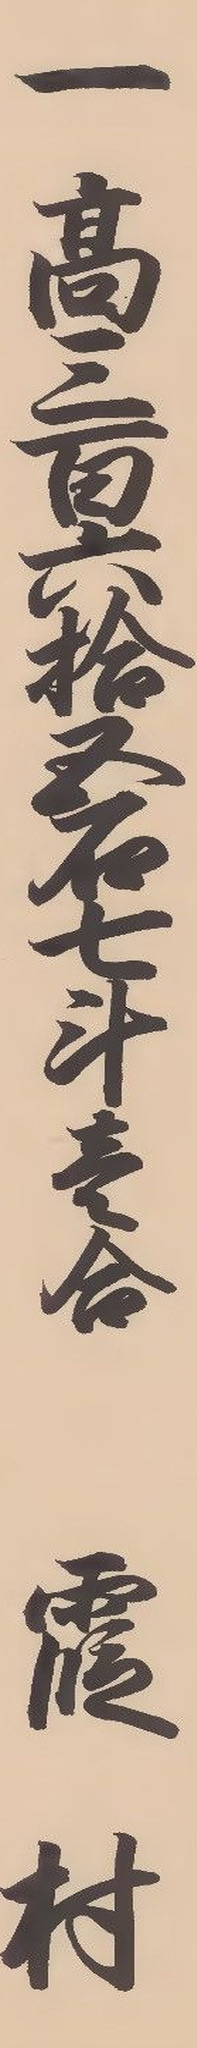一高三百六拾五石七斗壱合霞村
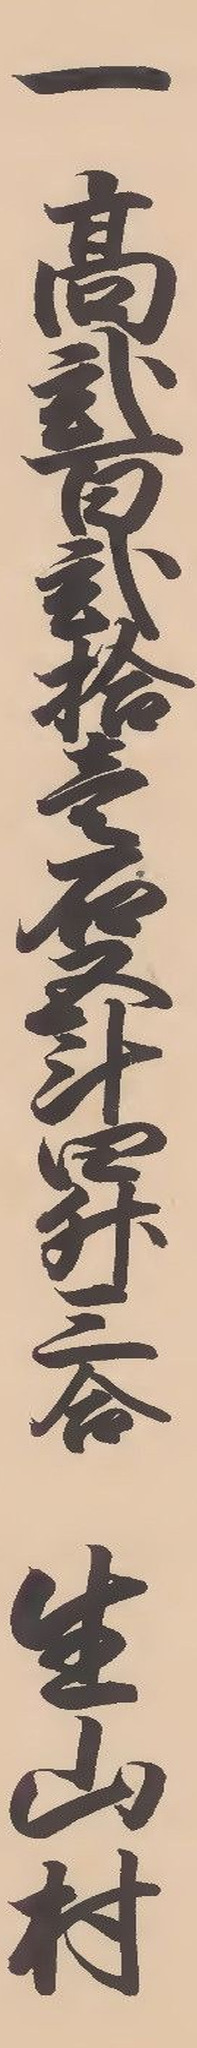一高弐百弐拾壱石五斗四升三合生山村
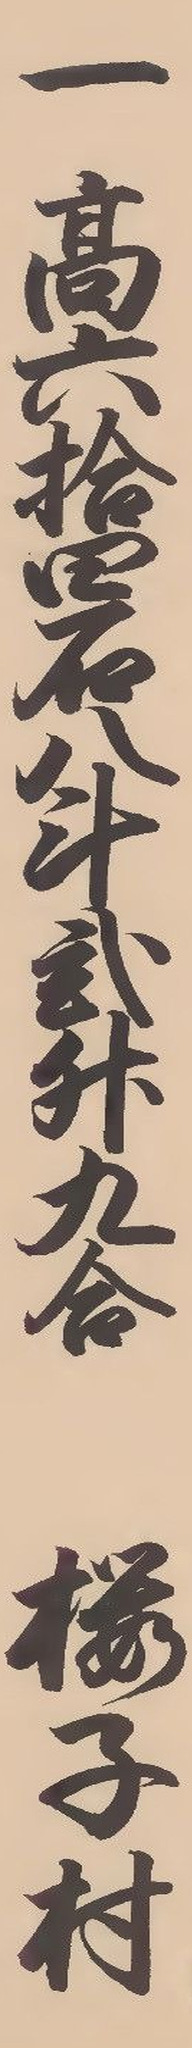一高六拾四石八斗弐升九合桜子村
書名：伯耆国郷帳
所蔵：国立公文書館 National Archives of Japan
